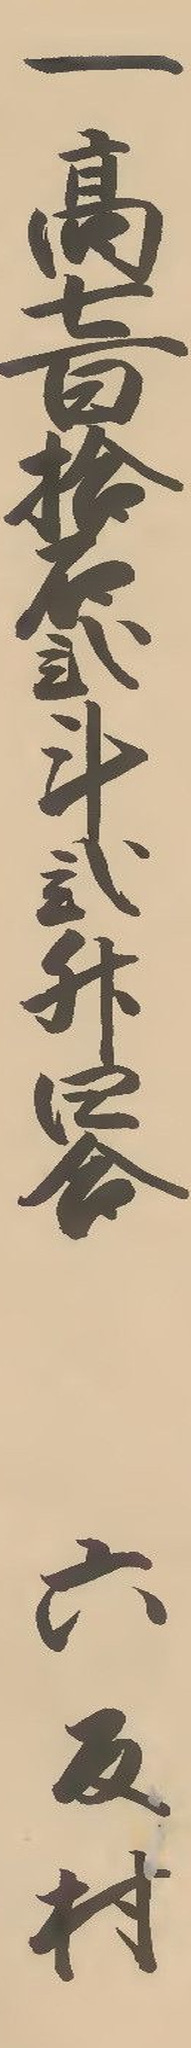一高七百拾石弐斗弐升四合六反村
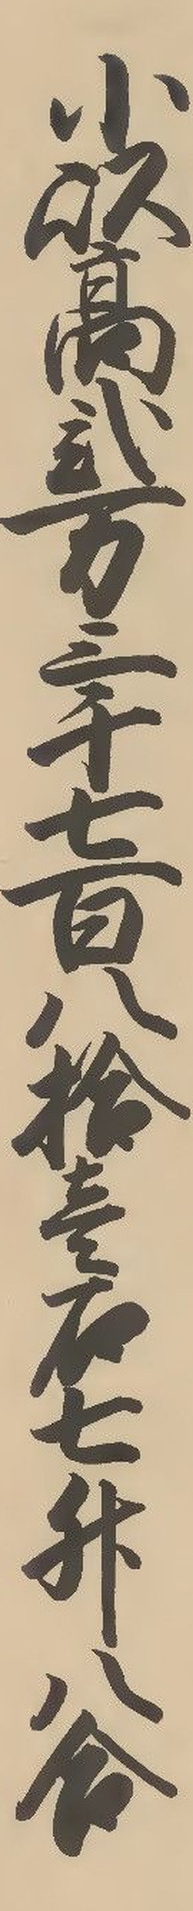小以高弐万三千七百八拾壱石七升八合

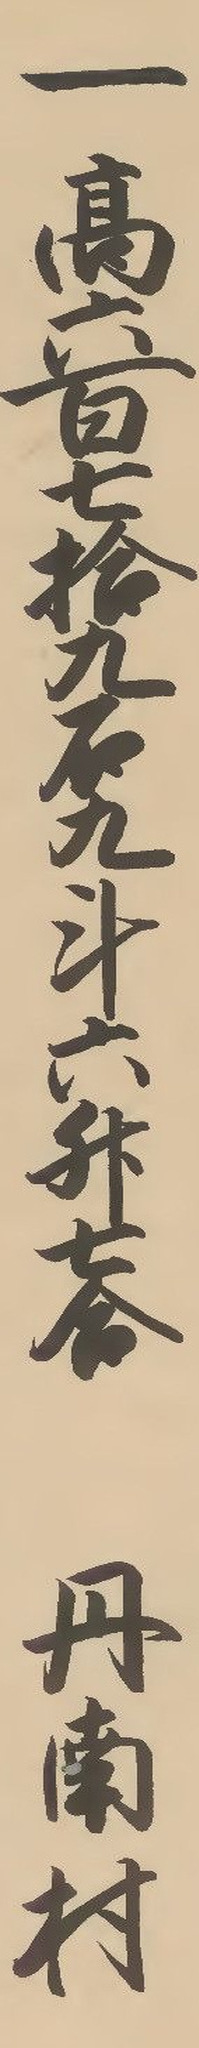一高六百七拾九石九斗六升七合丹南村
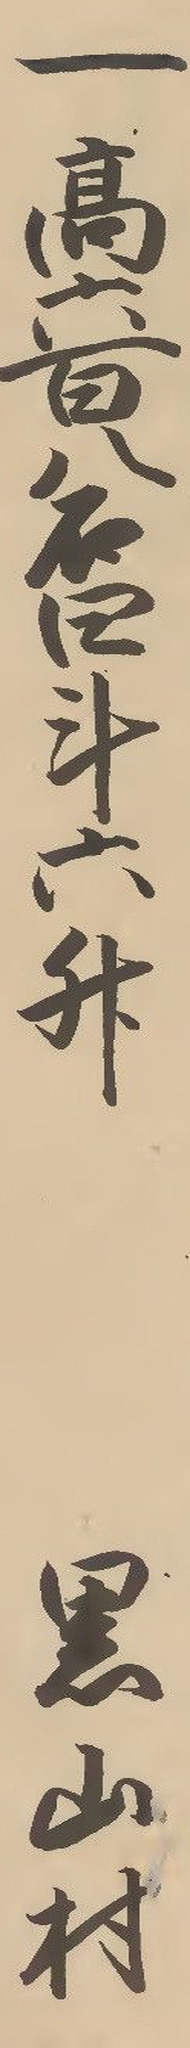一高六百八石四斗六升黒山村
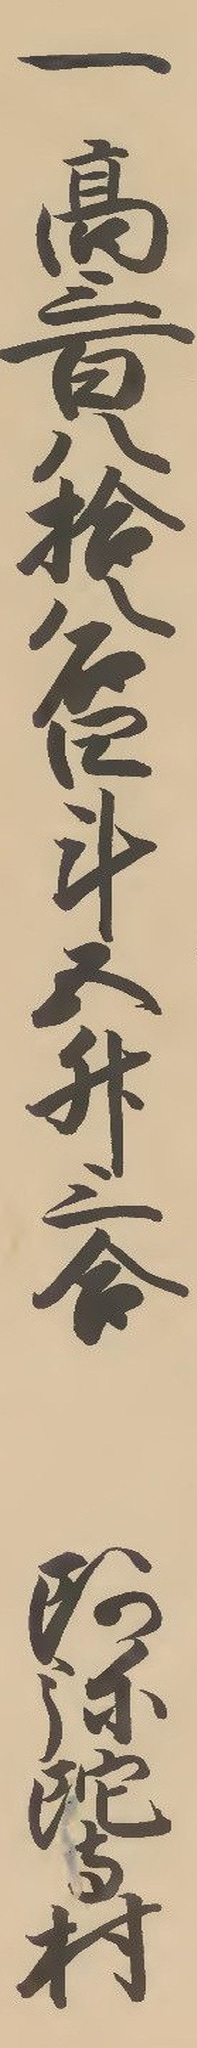一高三百八拾八石四斗五升三合阿弥陀寺村
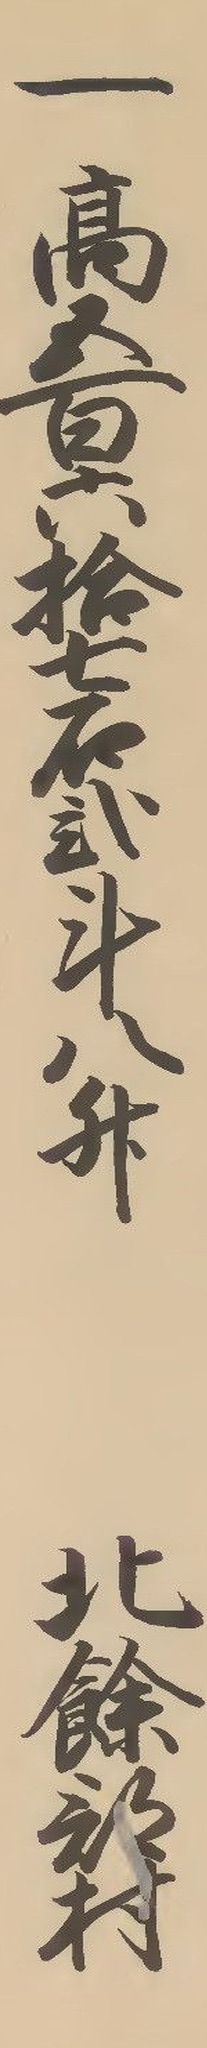一高五百六拾七石弐斗八升北余部村
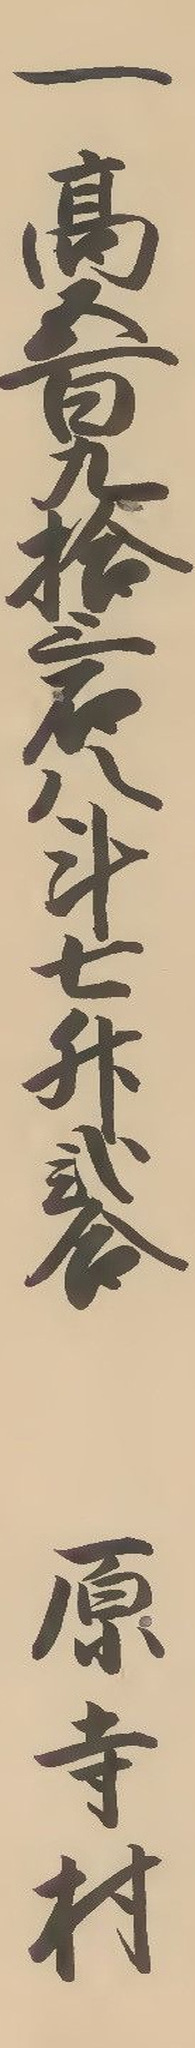一高五百九拾三石八斗七升弐合原寺村

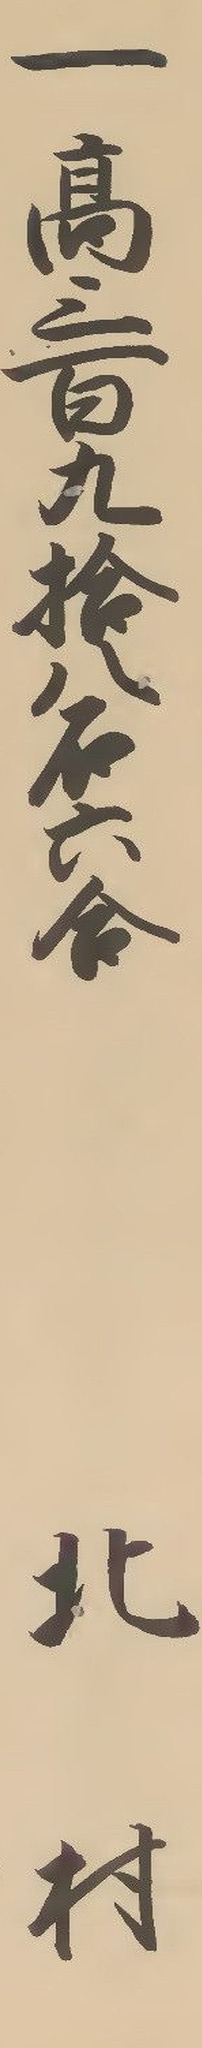一高三百九拾八石六合北村
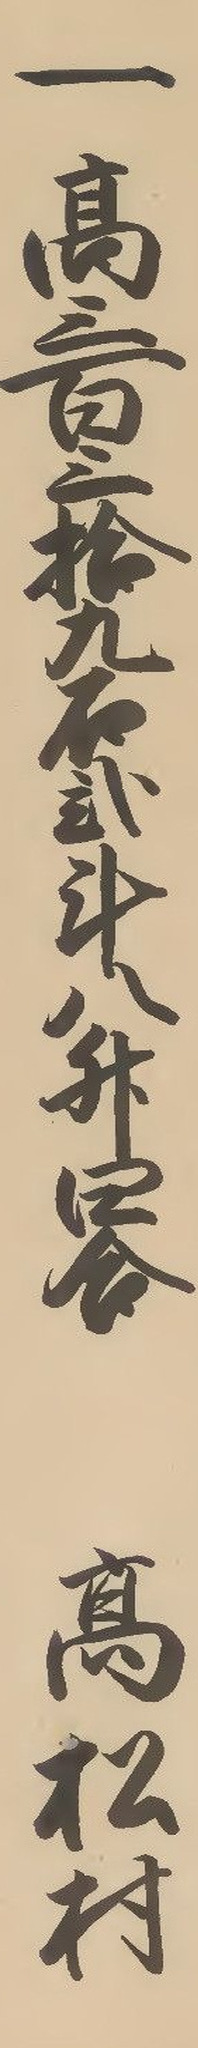一高三百三拾九石弐斗八升四合高松村
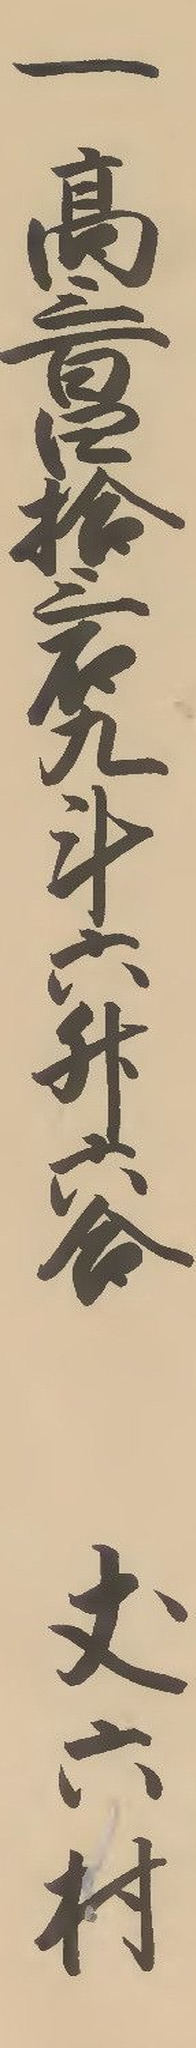一高三百四拾三石九斗六升六合丈六村
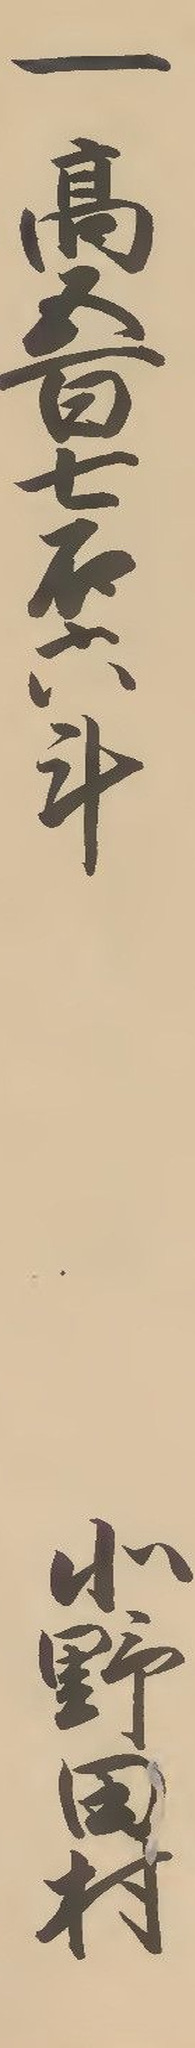一高五百七石六斗北野田村
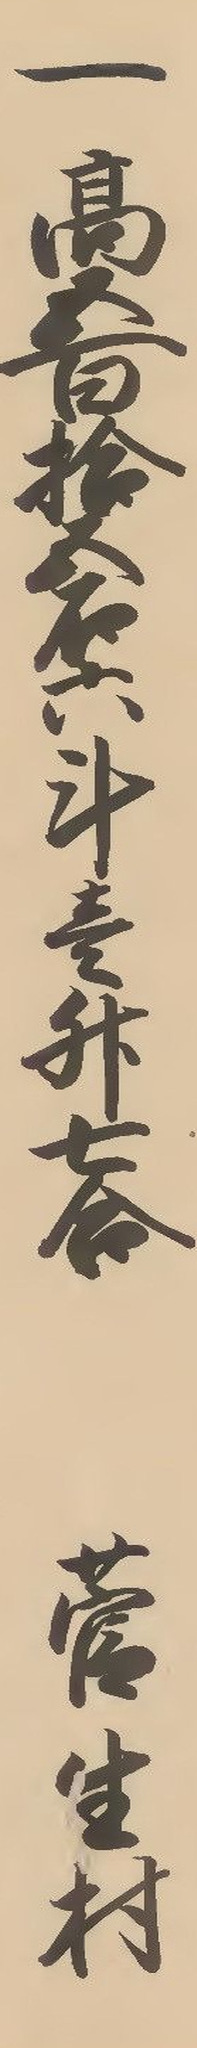一高五百拾五石六斗壱升七合菅生村
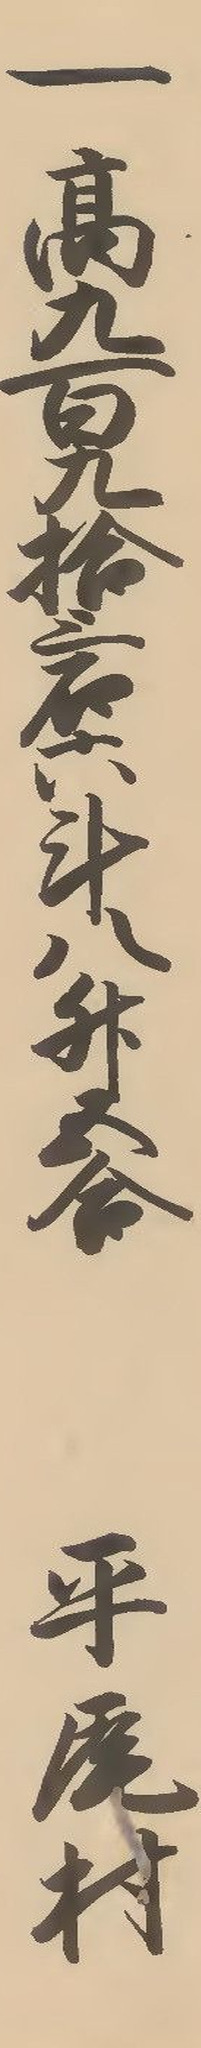一高九百九拾三石六斗八升五合平尾村
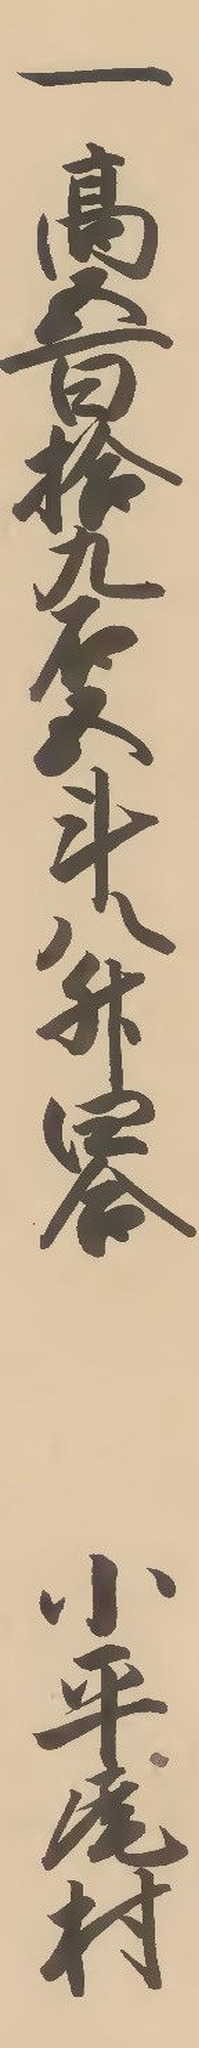一高五百拾九石五斗八升四合小平尾村
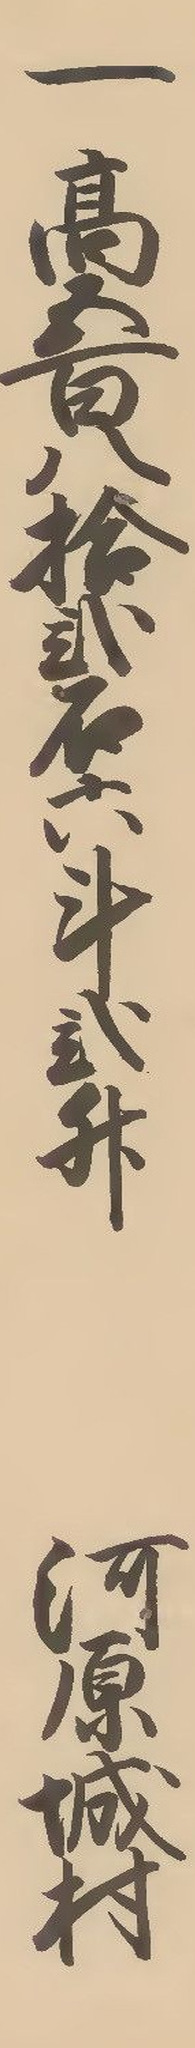一高五百八拾弐石六斗弐升河原城村

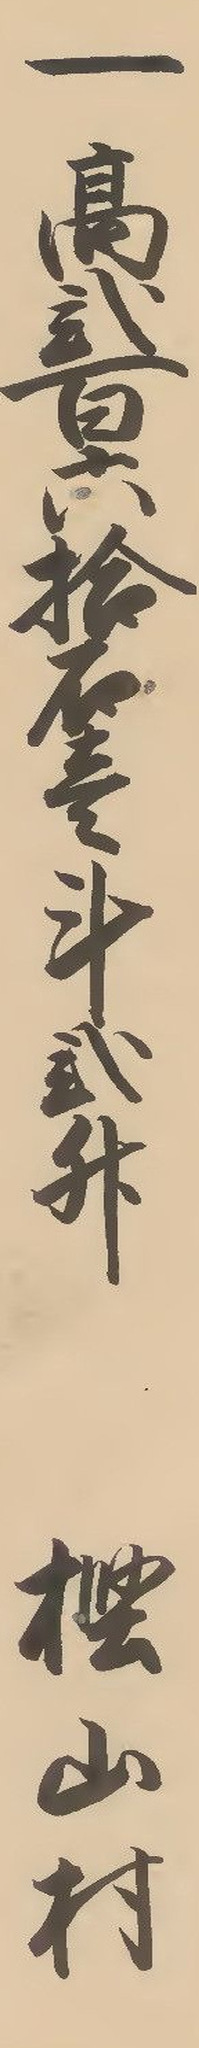一高弐百六拾石壱斗弐升樫山村
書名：河内国郷帳
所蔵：国立公文書館 National Archives of Japan
